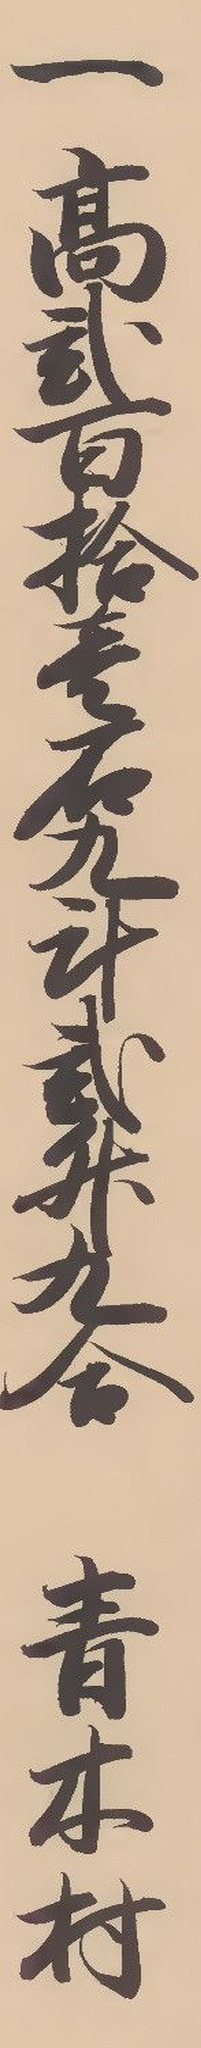一高弐百拾壱石九斗弐升九合青木村
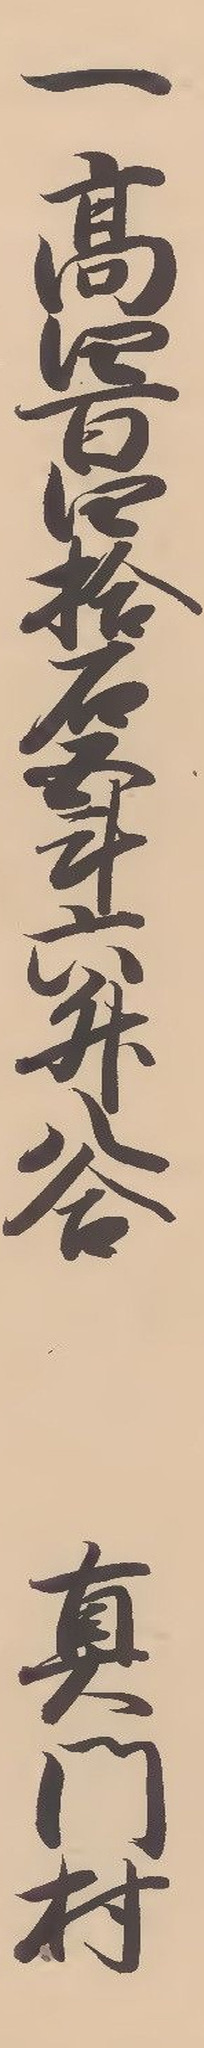一高四百四拾石五斗六升八合真門村
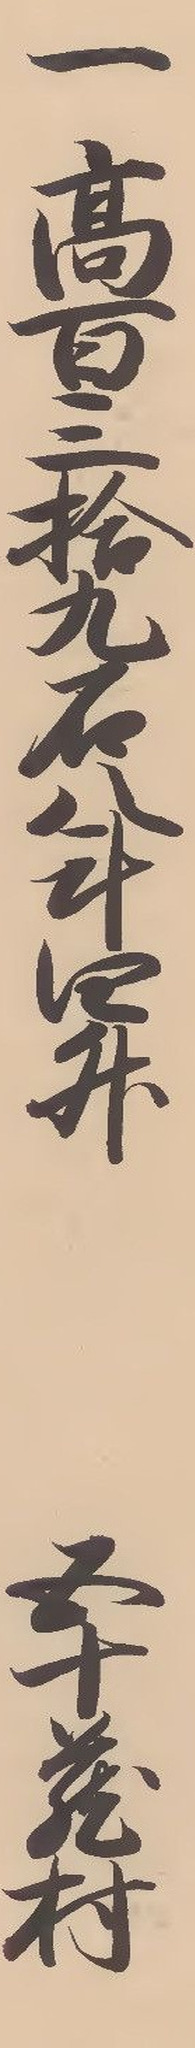一高百三拾九石八斗四升五十蔵村
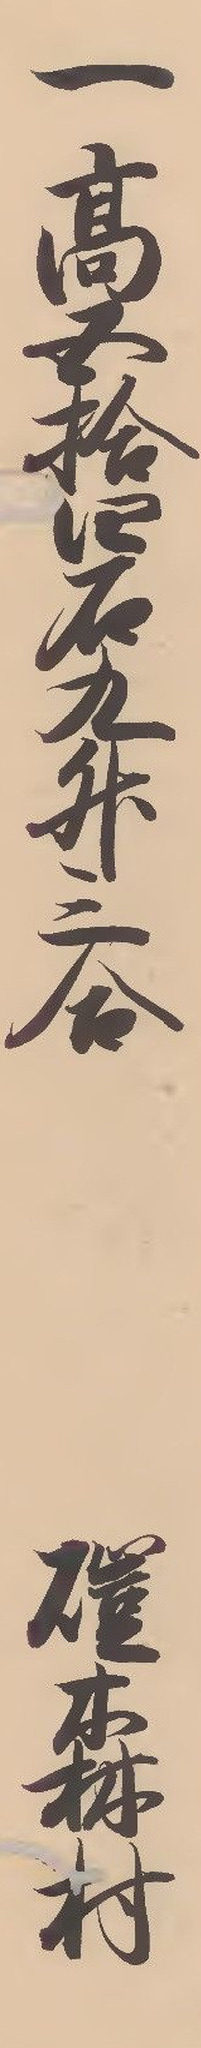一高五拾四石九升三合磑森村

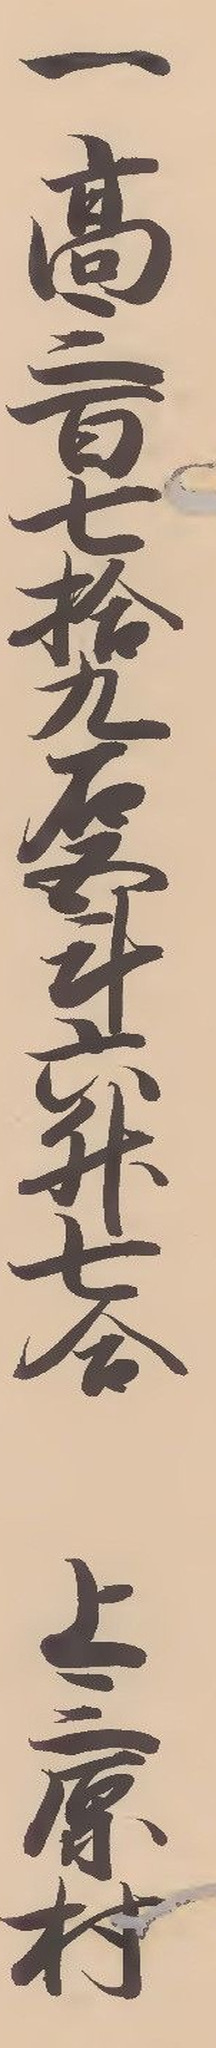一高三百七拾九石五斗六升七合上三原村
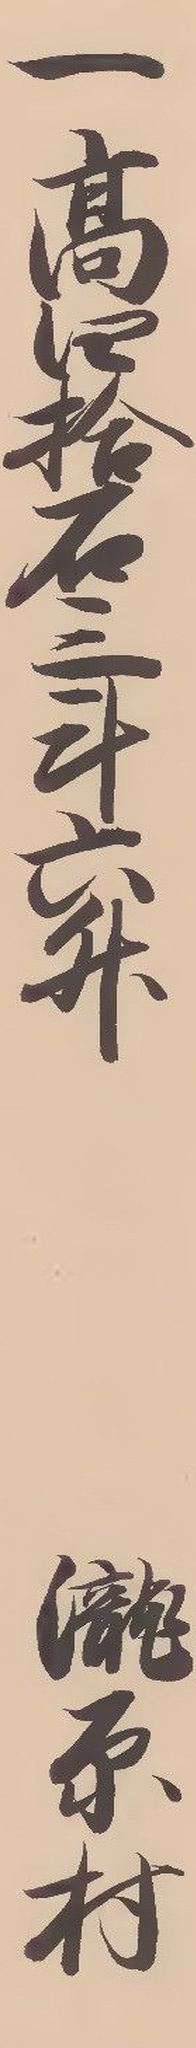一高四拾石三斗六升滝原村
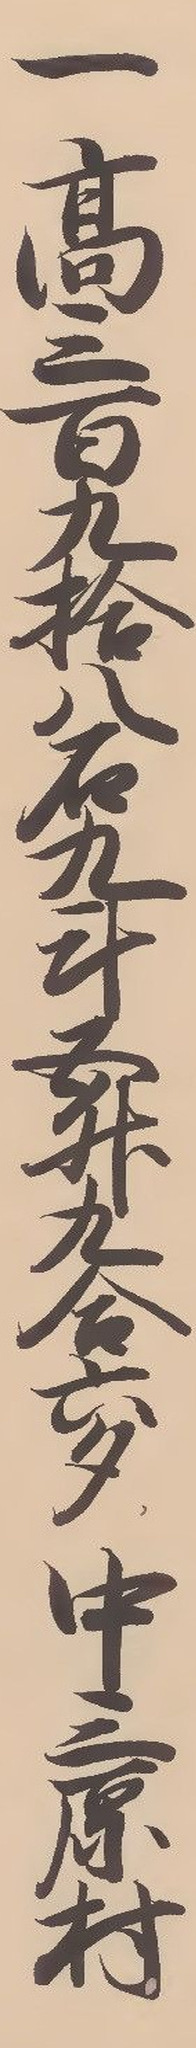一高三百九拾八石九斗五升九合六勺中三原村
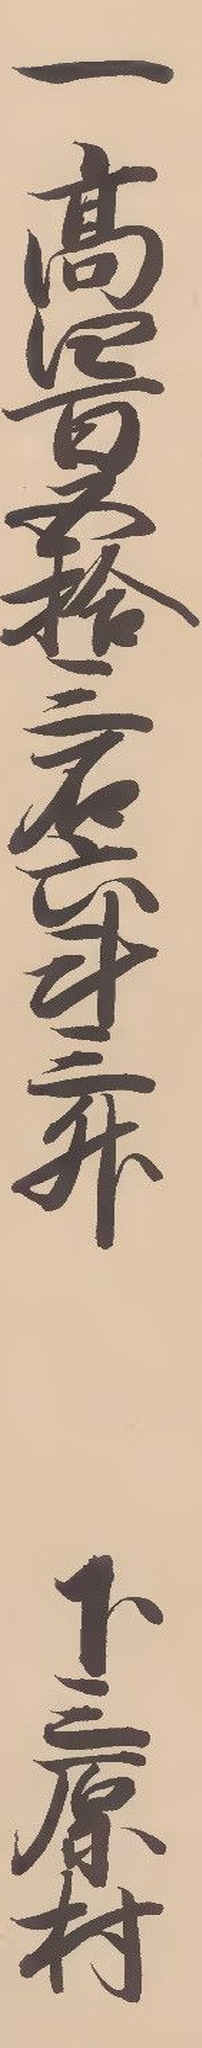一高四百五拾三石六斗三升下三原村
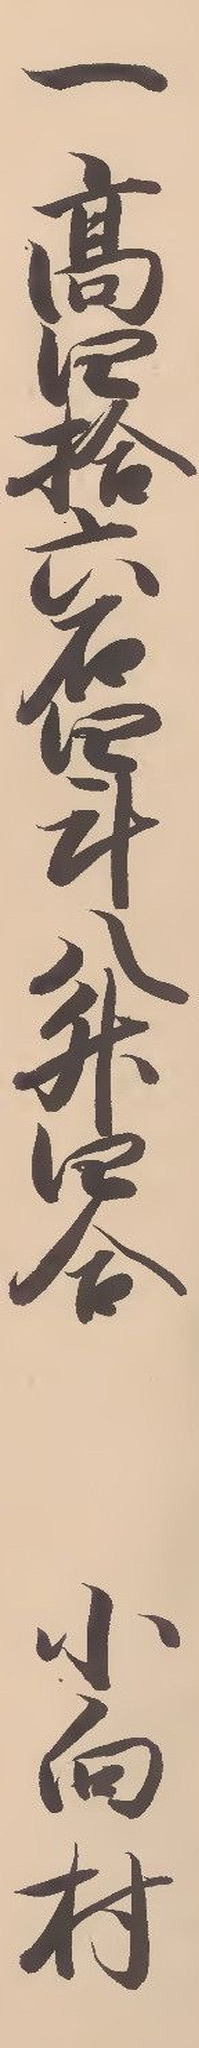一高四拾六石四斗八升四合小向村
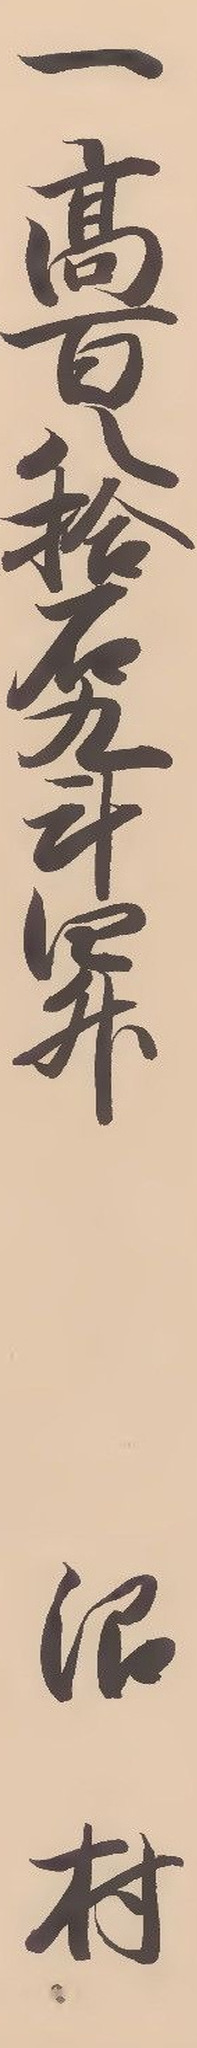一高百八拾石九斗四升沼村
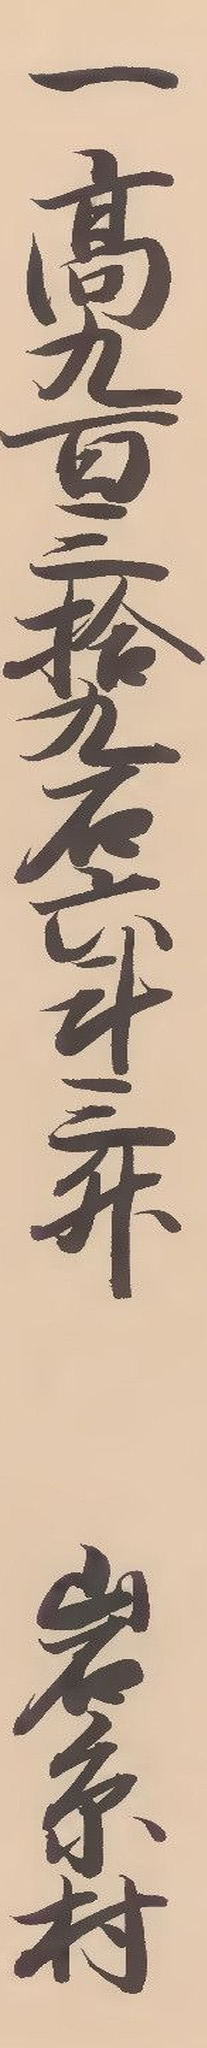一高九百三拾九石六斗三升岩糸村
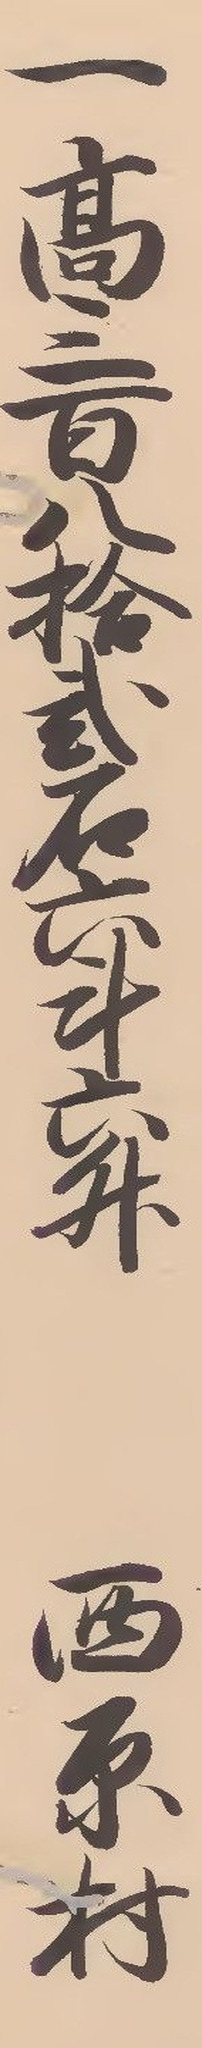一高三百八拾弐石六斗六升西原村

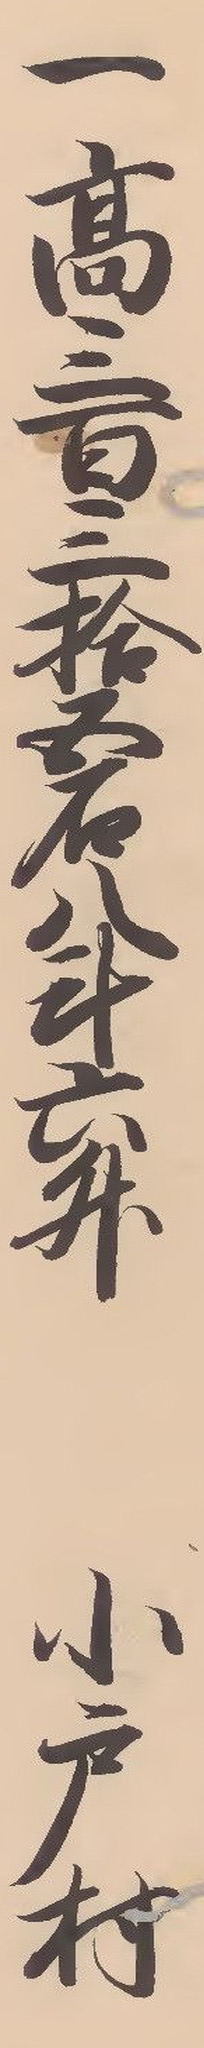一高三百三拾五石八斗六升小戸村
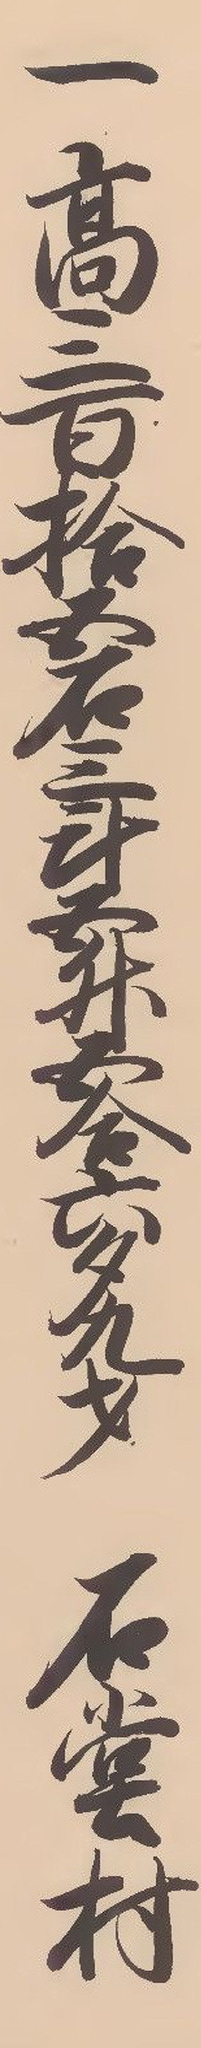一高三百拾五石三斗五升五合六勺九才石堂村
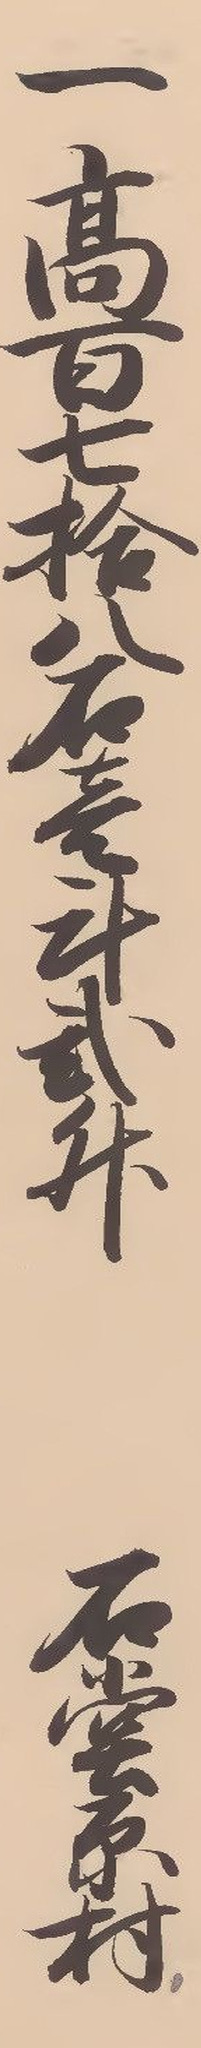一高百七拾八石壱斗弐升石堂原村
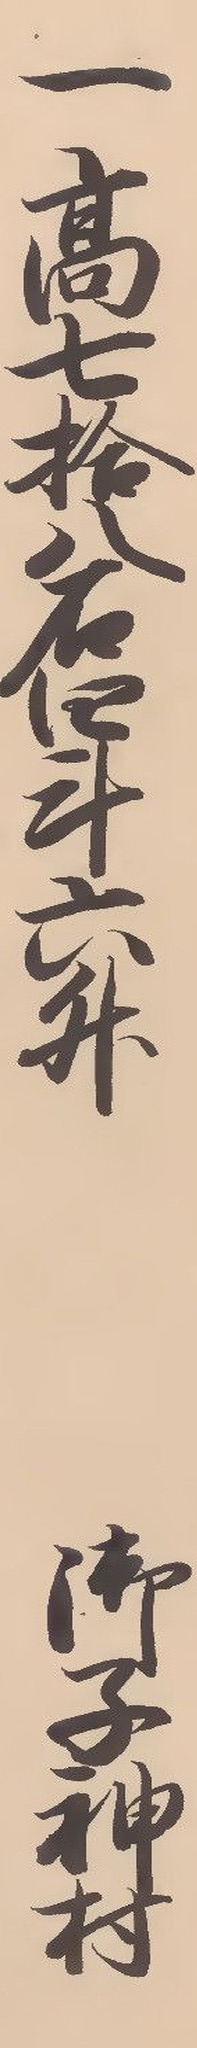一高七拾八石四斗六升御子神村
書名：安房国郷帳
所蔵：国立公文書館 National Archives of Japan
